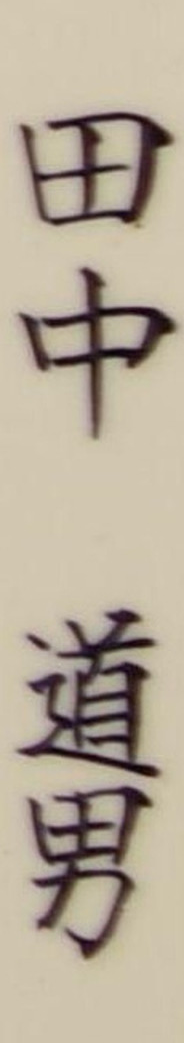田中道男
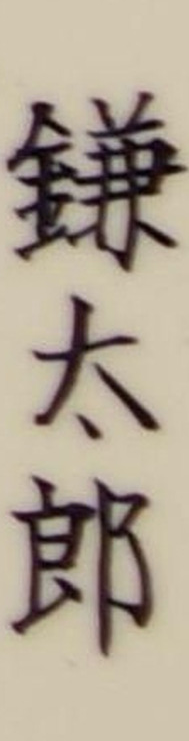鎌太郎
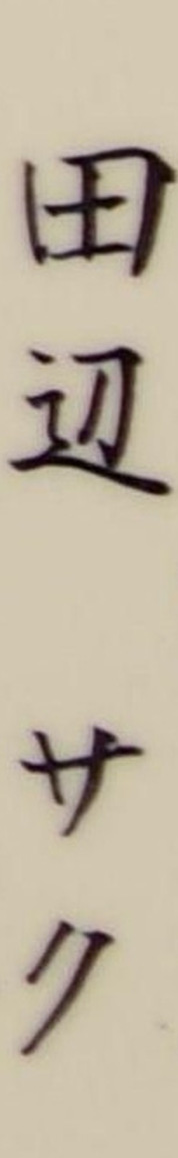田辺サク
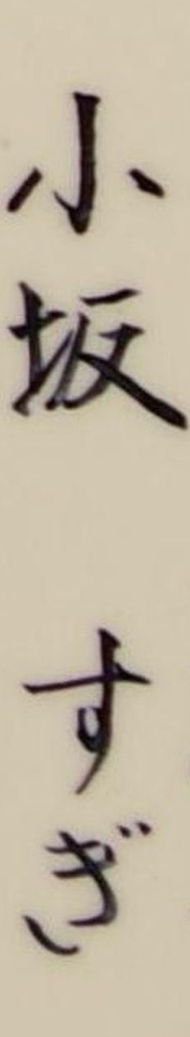小坂すぎ
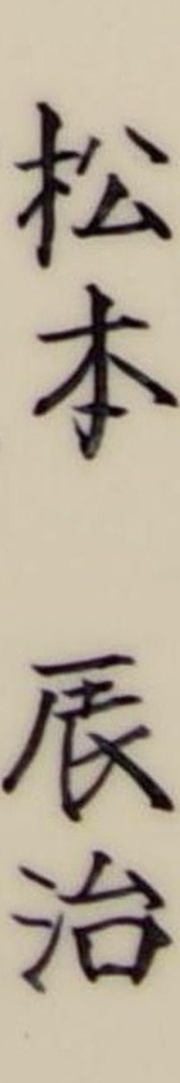松本辰治
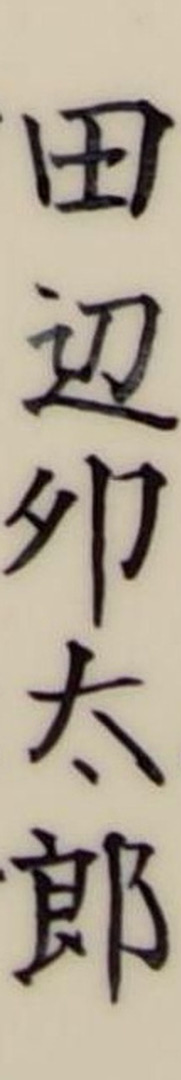田辺卯太郎
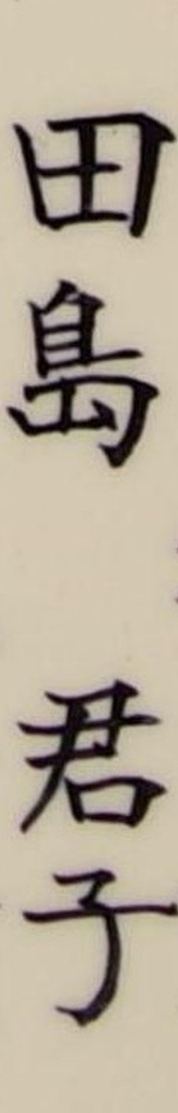田島君子
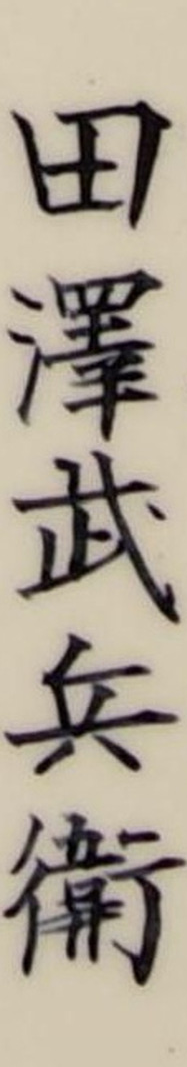田澤武兵衛
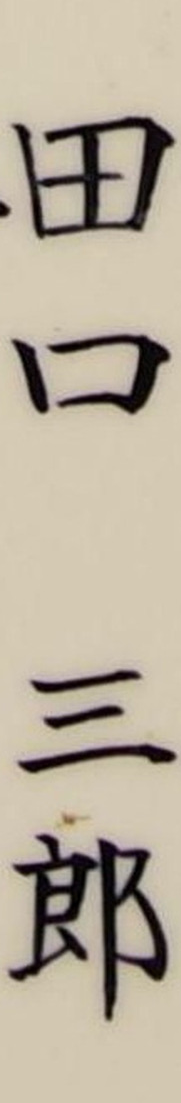田口三郎
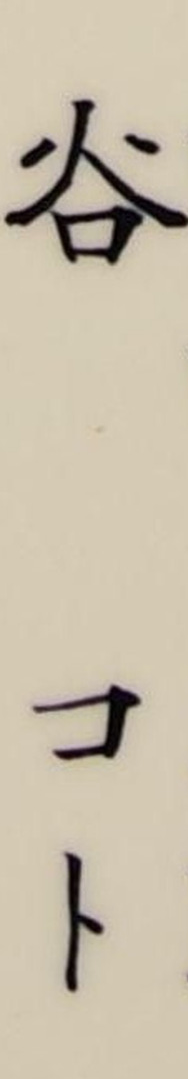谷コト
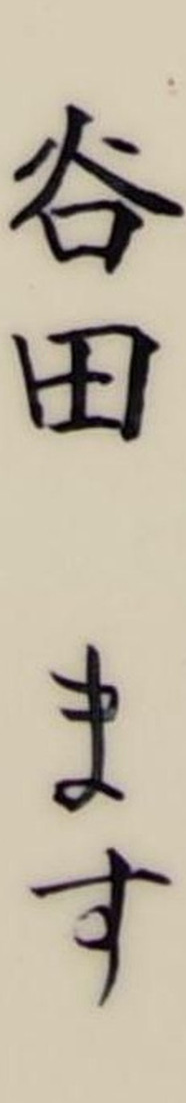谷田ます
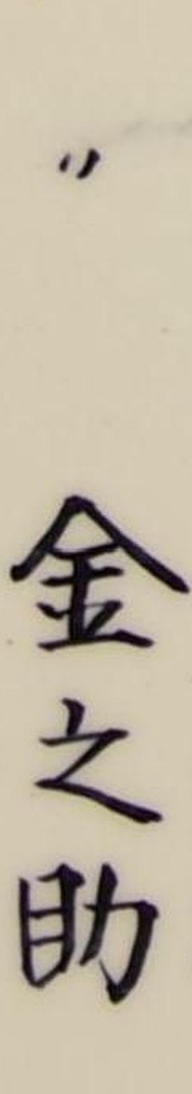金之助
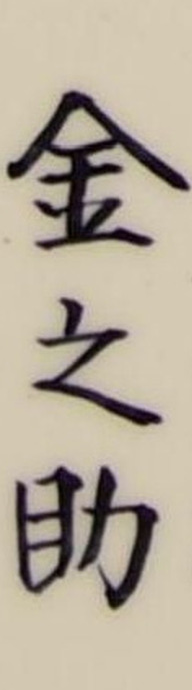金之助
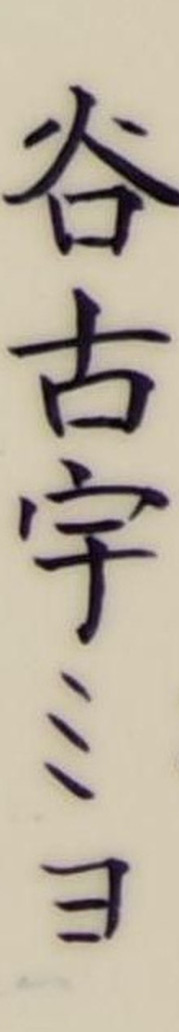谷古宇ミヨ
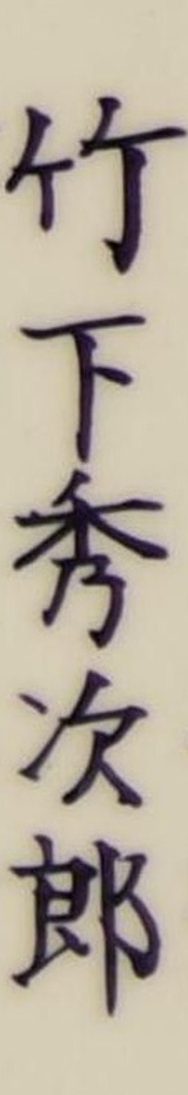竹下秀次郎
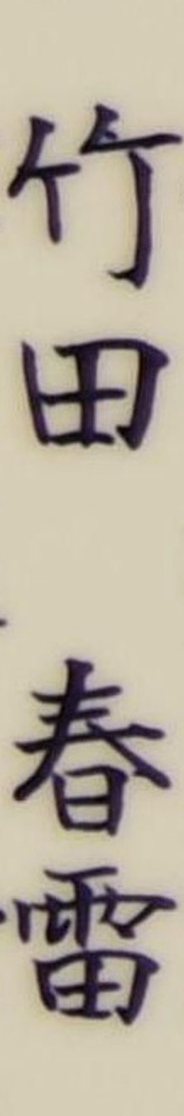竹田春雷
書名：A~D
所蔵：koyasan kongobuji
